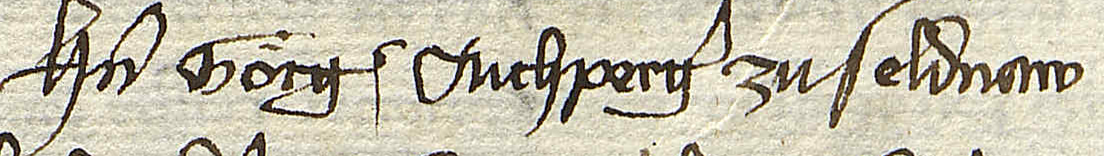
H*n Görg* Aichperg* ʒu ſeldnaw
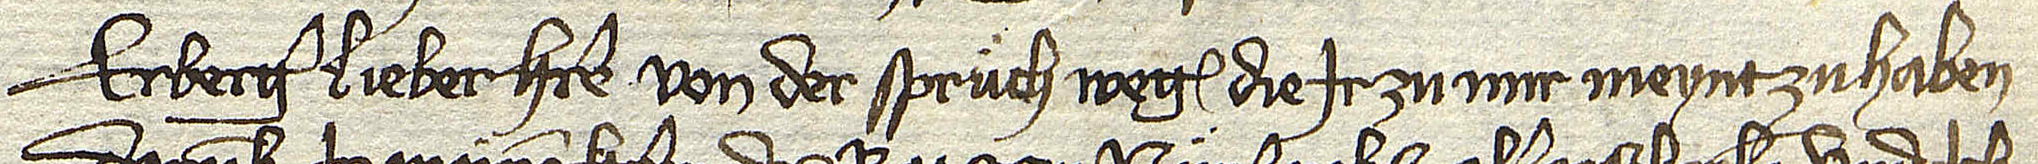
Erberg* lieber h*re von der ſprüch weg* die Ir ʒu mir meynt ʒu haben
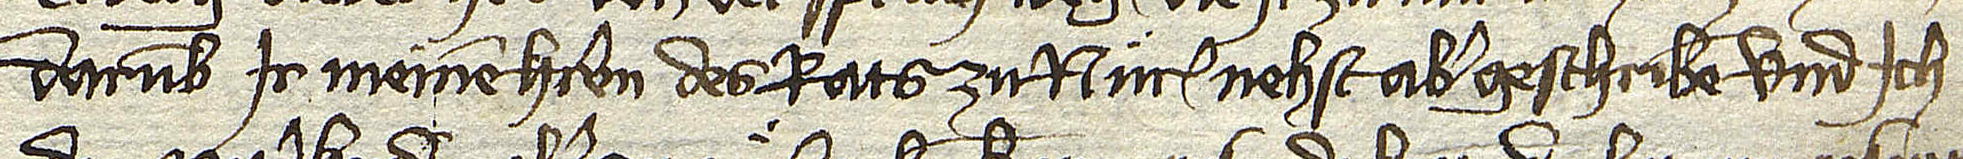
daru*b Ir meine* h*ren des Rats ʒu Nür* nehſt ab* geſchribe* Vnd Ich
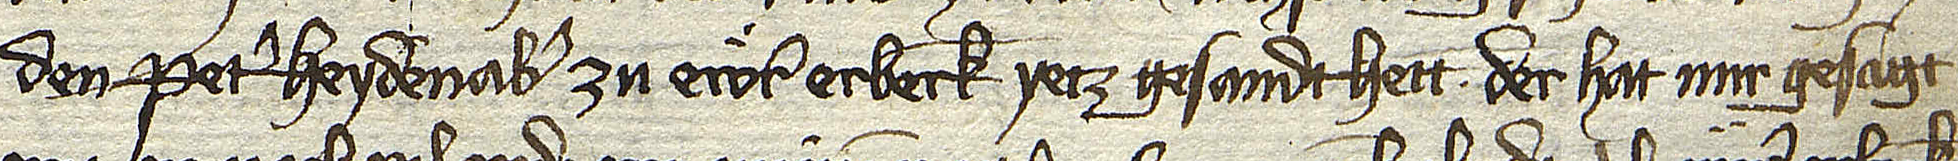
den Pet* heydenab* ʒu ew*r erberk* yecʒ geſandt hett . der hat mir geſagt
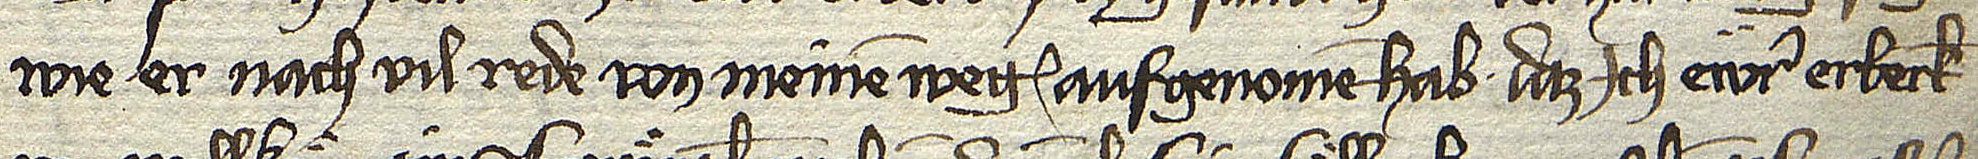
wie er nach vil rede von meine* weg* aufgenome* hab . daʒ Ich ew*r erberk*
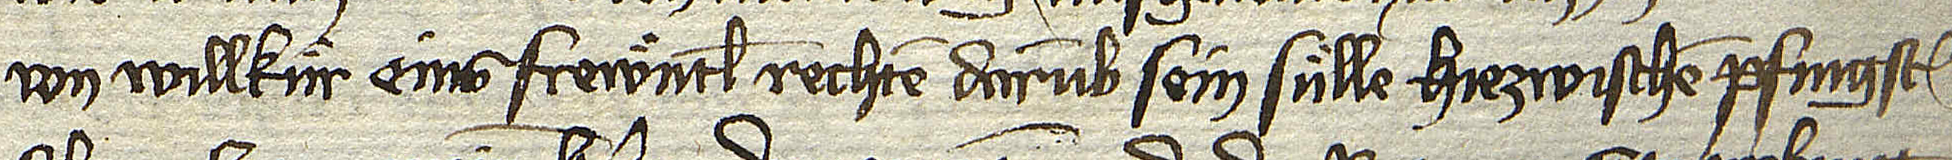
von willkür eins frewntl* rechte* daru*b ſein ſülle hieʒwiſche* Pfingſt*
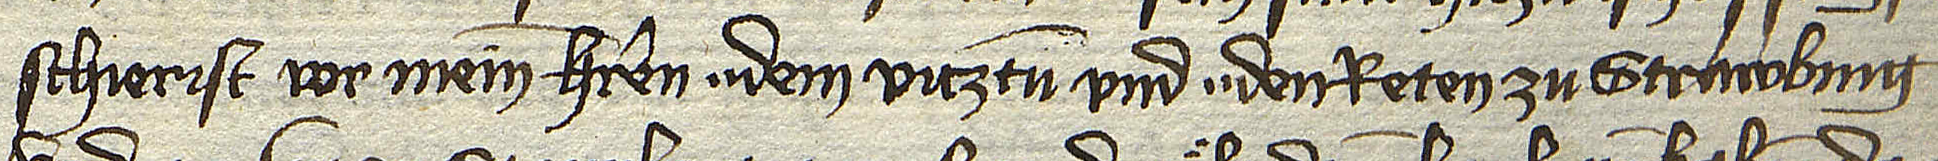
ſchieriſt vor mein* h*ren ~ dem vicʒtu* vnd ~ den Reten ʒu Strawbing
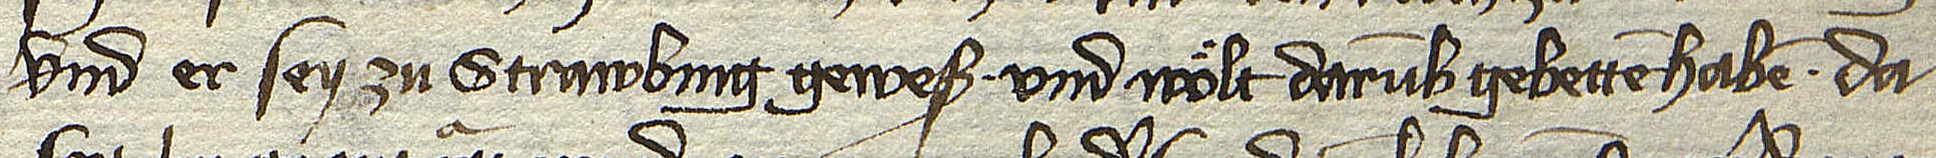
Vnd er ſey ʒu Strawbing geweſ* . vnd wölt daru*b gebette* habe* . da
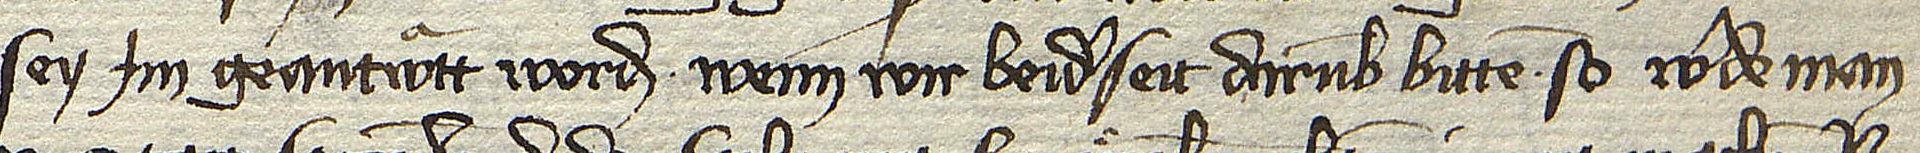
ſey Im geantw*tt word* . wenn wir beid*ſeit daru*b bitte* . ſo w*de man
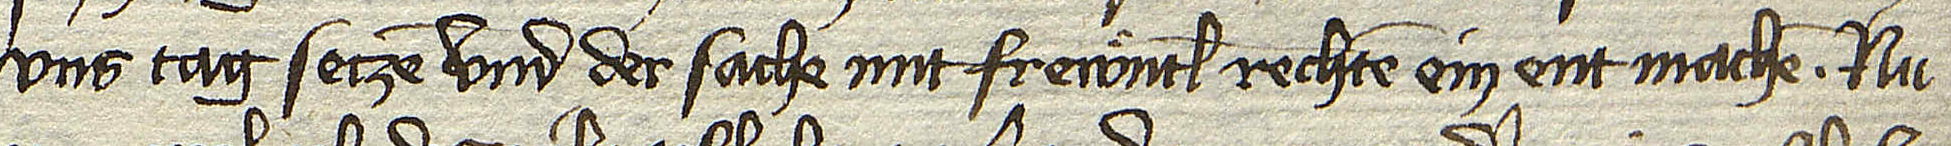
vns tag ſecʒe* Vnd der ſache mit frewntl* rechte* ein ent mache* . Nu
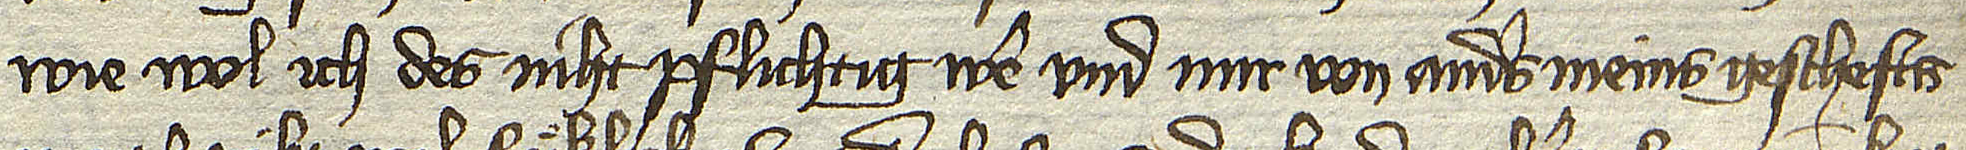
wie wol ich des niht pflichtig we* vnd mir von and*s meins geſchefts
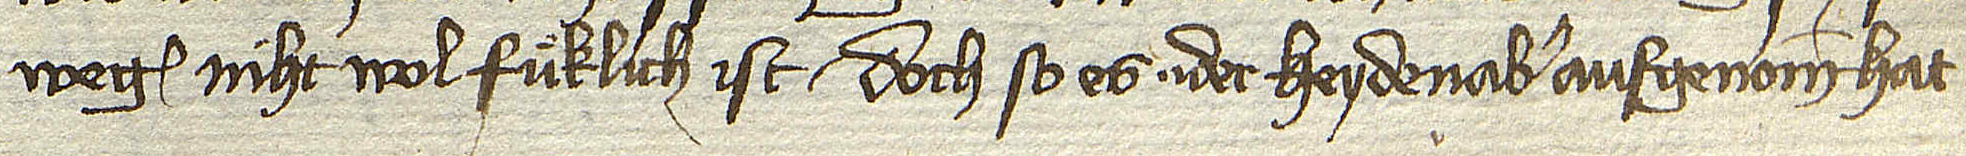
weg* niht wol füklich iſt / Doch ſo es ~ der heydenab* aufgenom* hat
